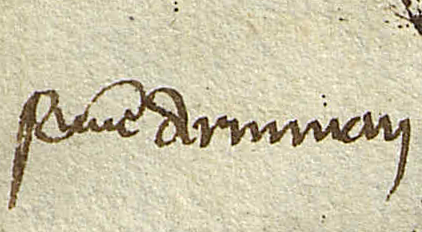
ſeine* Armman
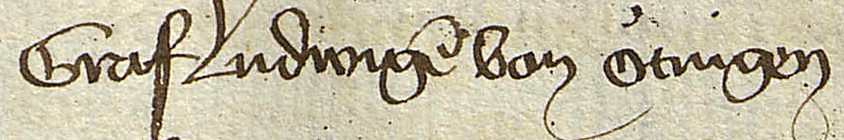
Graf Ludwige* von Ötingen
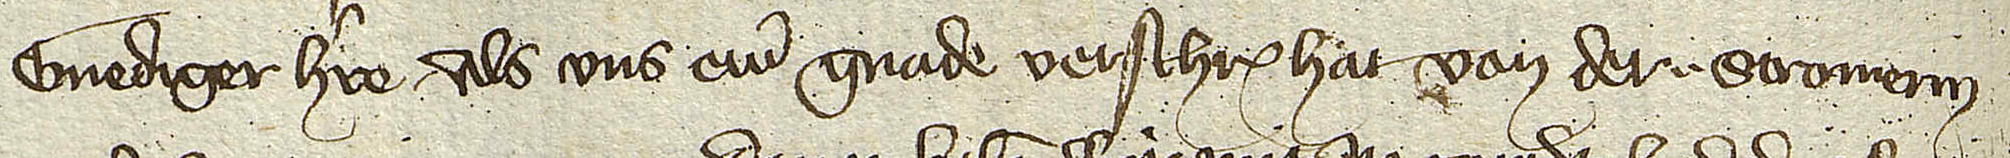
Gnediger hre* / Als vns ew* gnade verſchr* hat von der ~ Stromern
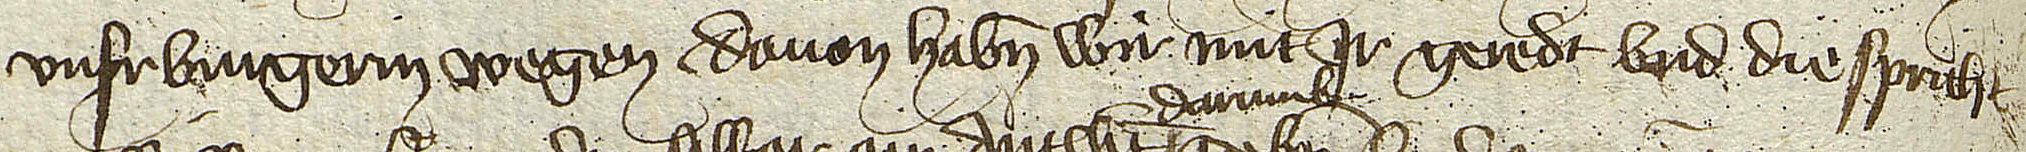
vnſ*r burgerin wegen / dauon habn* wir mit Ir geredt vnd die ſpricht
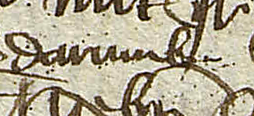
darumb
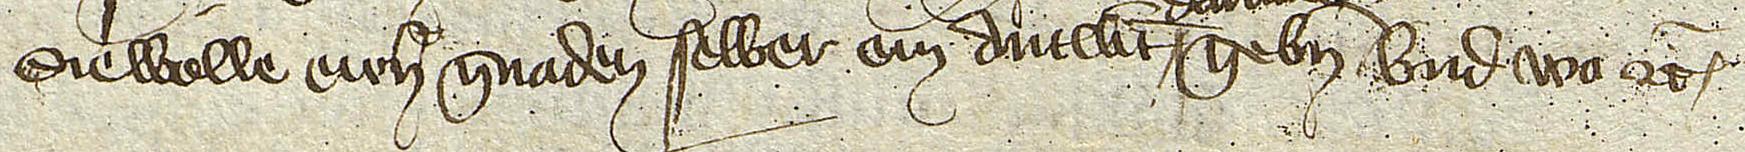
Sie wölle ew*n gnaden ſelber ein Antwt* gebn* vnd wo ec*
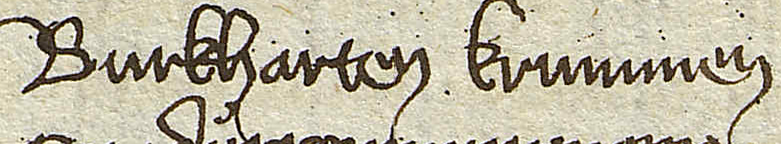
Burkharten Krummen
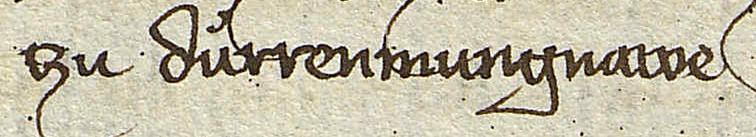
cʒu dürrenmungnawe
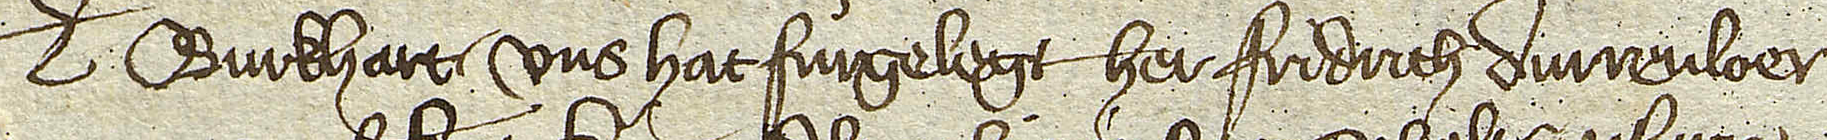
L* Burkhart / vns hat fürgelegt her fridrich durrenloer
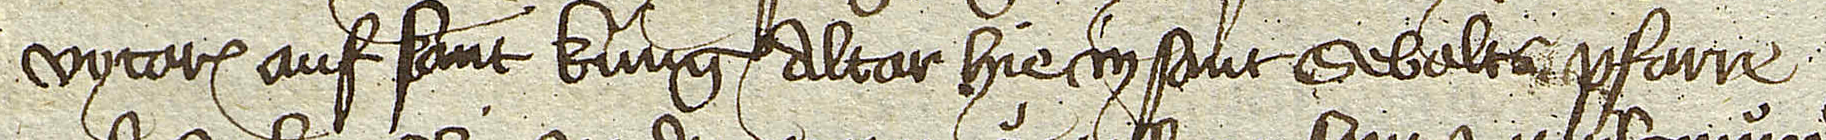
vycar* auf ſant küng Altar hie in ſant Sebolts pfarre
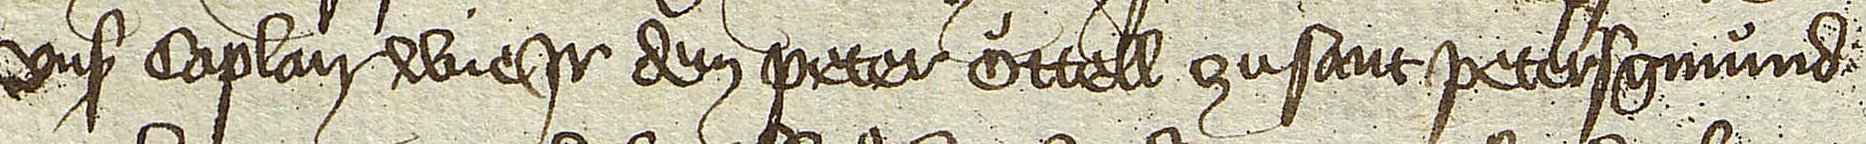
vnſ* Caplan wie Ir dem peter Öttell cʒu ſant peterſgmünd
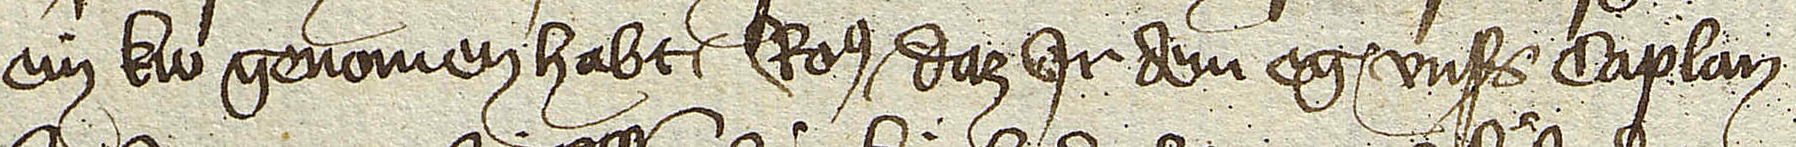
ein kw genomen habt / Ro* / daʒ Ir dem eg* vnſ*s Caplan
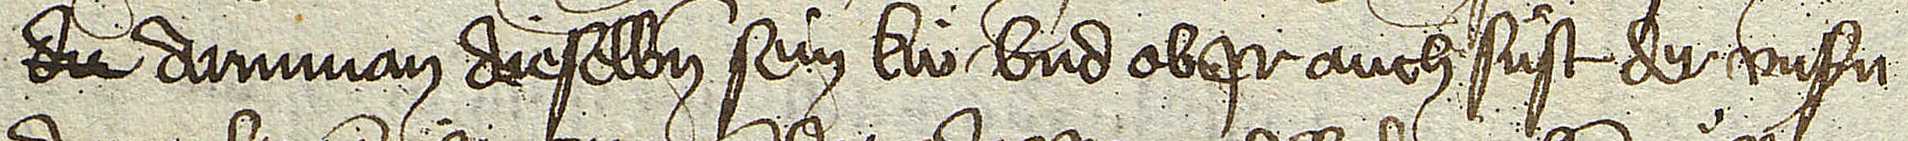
di Armman dieſelbn* ſein kw / vnd ob Ir auch ſüſt der vnſ*n
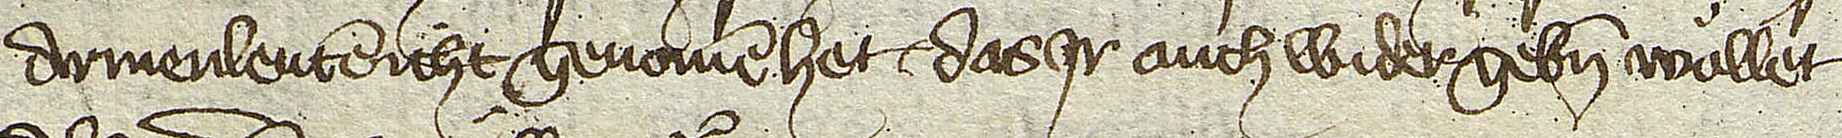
Armenleute* icht genome* het / das Ir auch wider gebn* wöllet
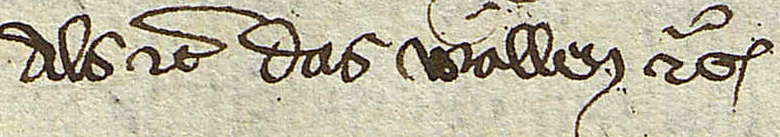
Als ec* das wöllen ec*
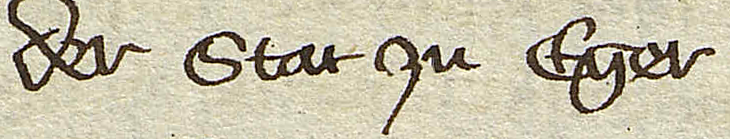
der Stat cʒu Eger
